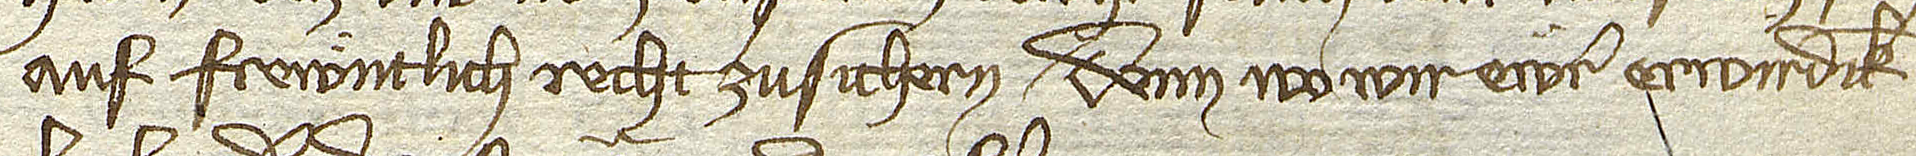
auf frewntlich recht ʒuſichern / Denn wo wir ew*r erwirdik*
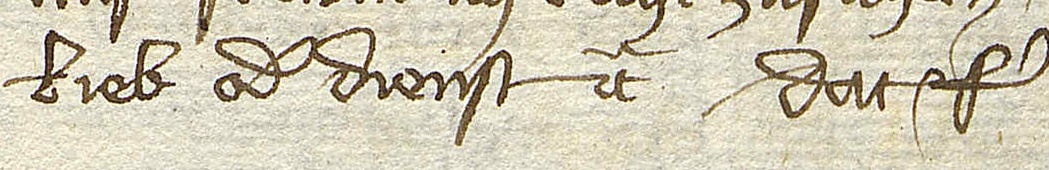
lieb od* dienſt ec* / dat* f*
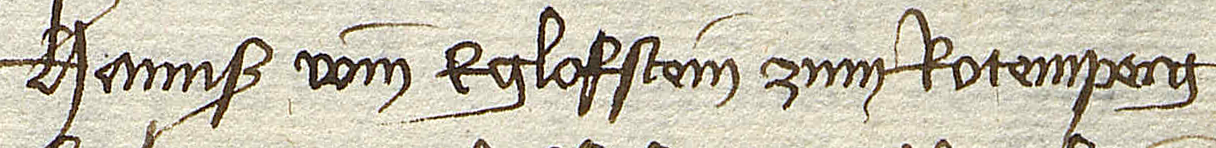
Hannſ* vom* Eglofſtein ʒum Rotemperg
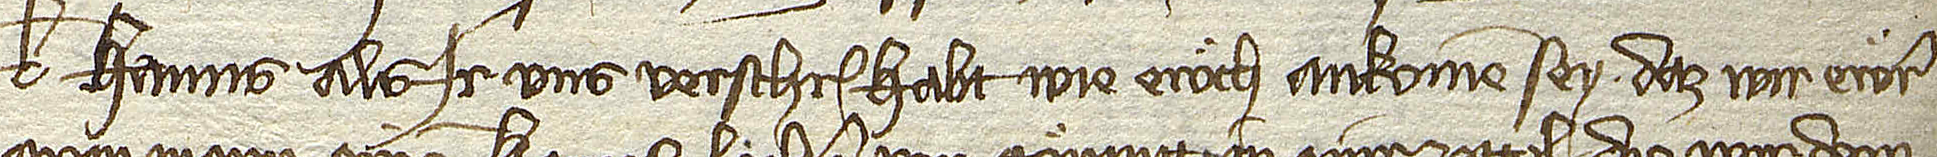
L* hanns als Ir vns verſchr* habt wie ewch ankome* ſey . daʒ wir ew*r
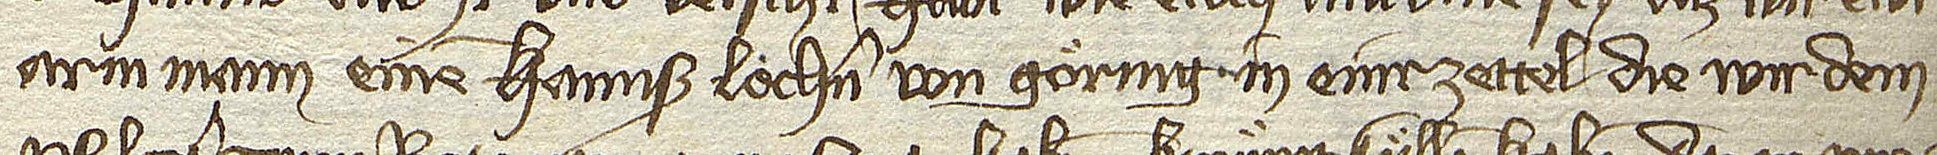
arm mann eine* hannſ* löchn* von görnig . in einr ʒettel die wir dem
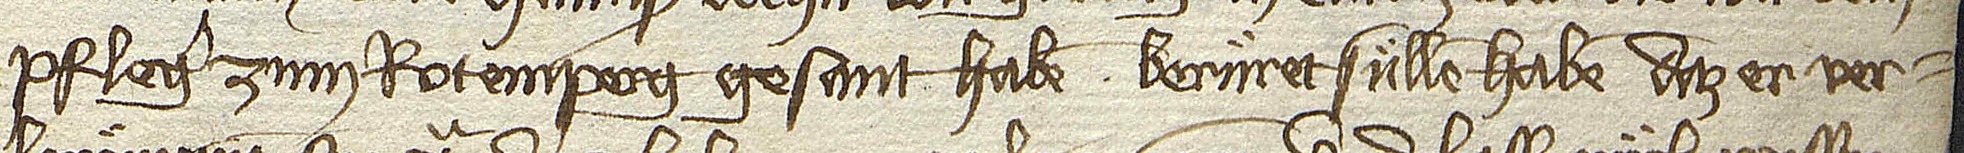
pfleg* ʒum Rotemperg geſant habe* . berüret ſülle* habe* daʒ er ver =
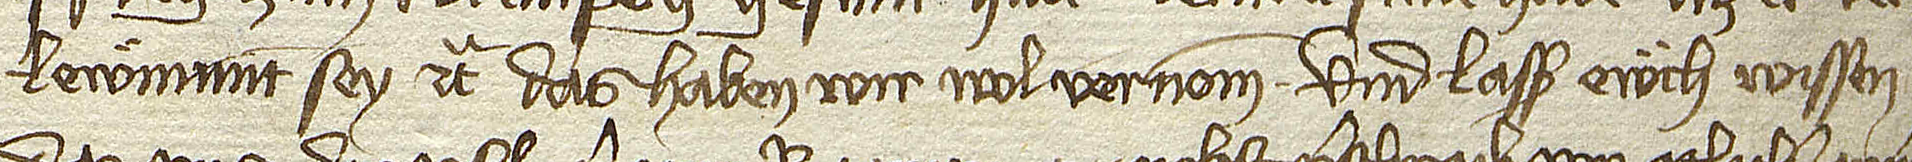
lewmunt ſey ec* das haben wir wol vernom* . Vnd laſſ* ewch wiſſen
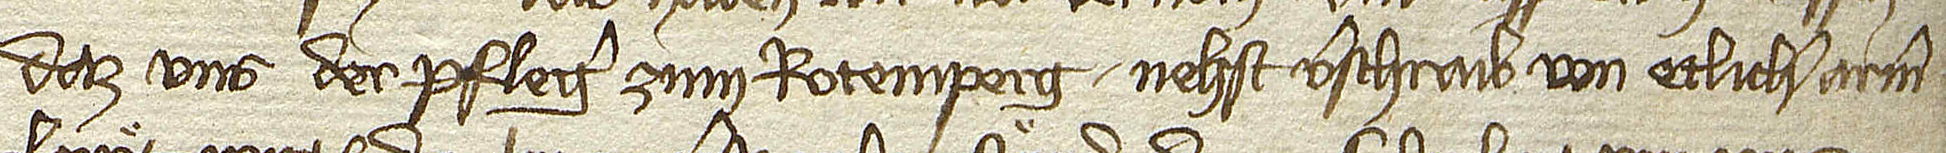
daʒ vns der Pfleg* ʒum Rotemperg / nehſt v*ſchraib von etlich* arm*
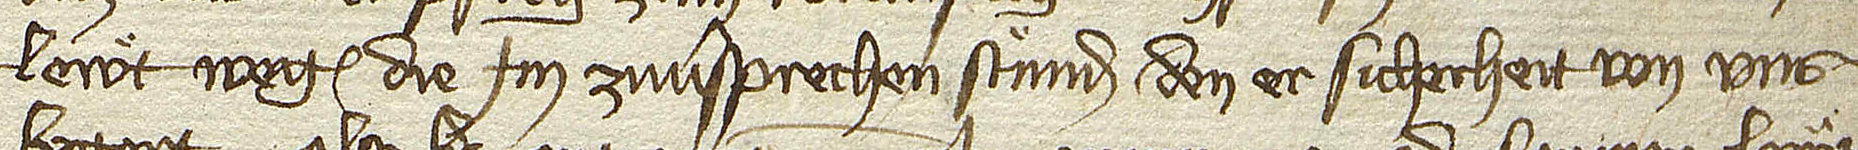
lewt weg* die Im ʒuu*ſprechen ſtünd* / den er ſicherheit von vns
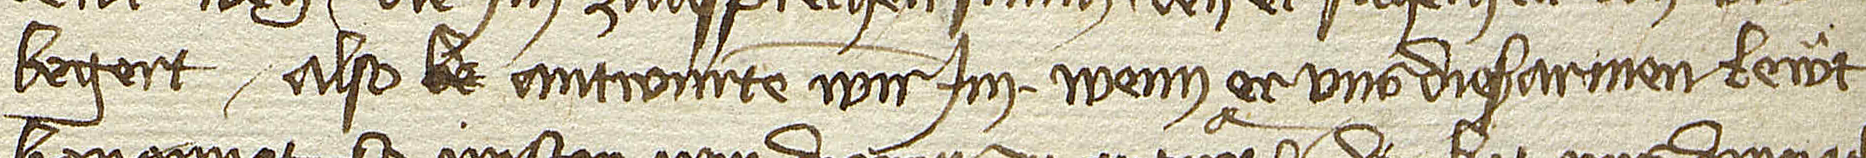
begert / Alſo be antwurte* wir Im . wenn er vns dieſ* armen lewt
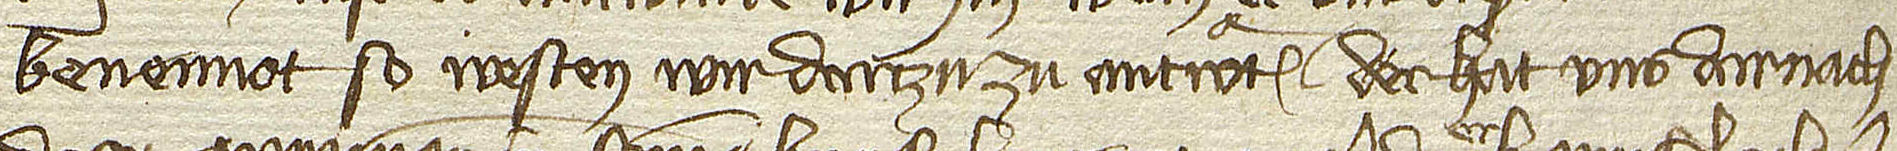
benennet ſo weſten wir darcʒu ʒu antw*t / der hat vns darnach
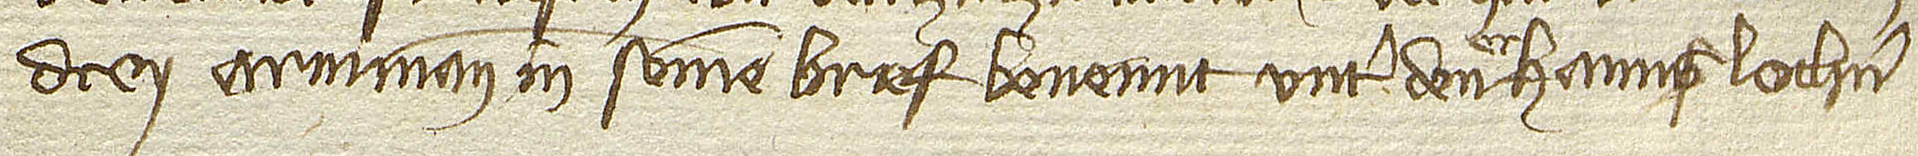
drey armman* in ſeine* brief benennt vnt* den hanns lochn*
